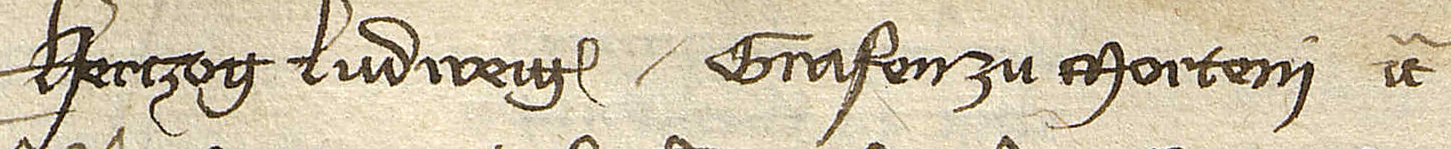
Hercʒog Ludweig* / Grafen ʒu Morteni ec*
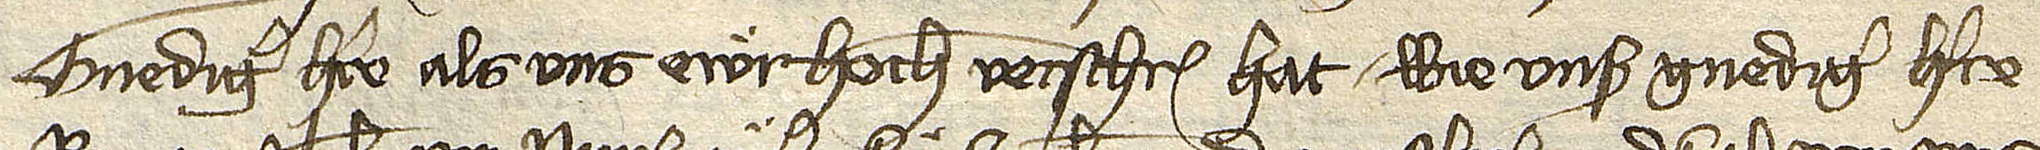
Gnedig* h*re als vns eẅr hoch* verſchr* hat / wie vnſ* gnedig* h*re
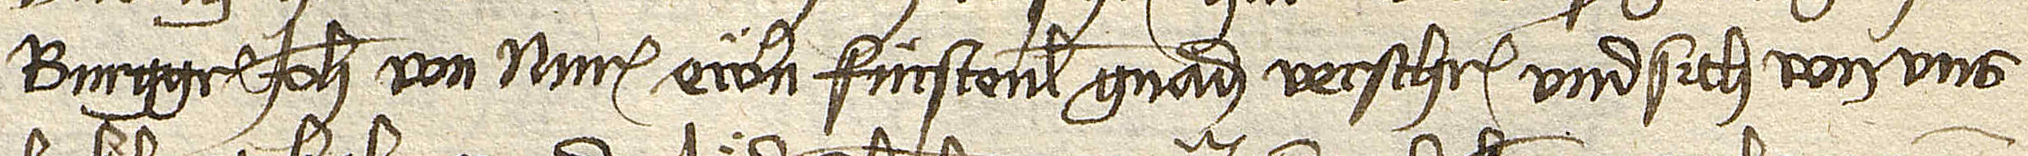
Burggr* Ioh* von Nur* eẅ*n fürſtenl* gnad* verſchr* vnd ſich von vns
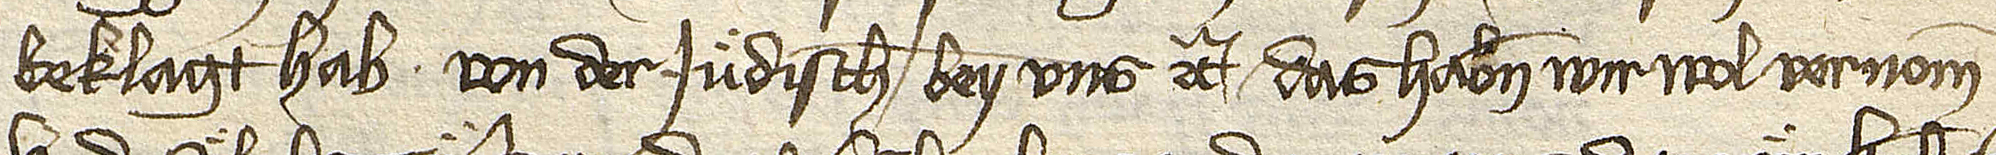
beklagt hab . von der Iüdiſch* bey vns ec* / das habn* wir wol vernom*
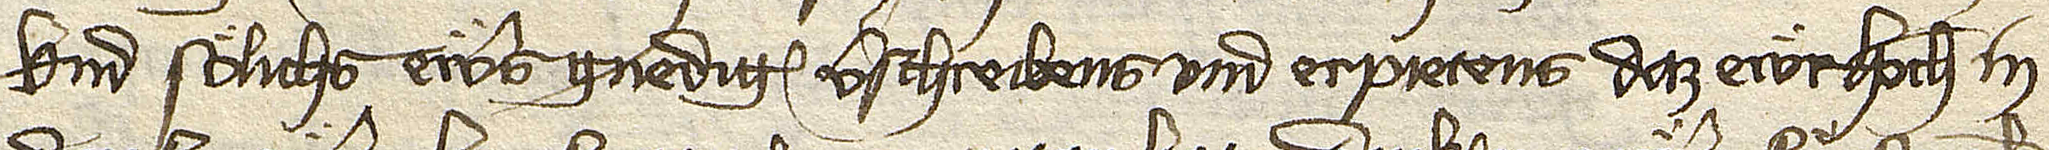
Vnd ſölichs eẅ*s gnedig* v*ſchreibens vnd erpietens daʒ eẅr hoch* in
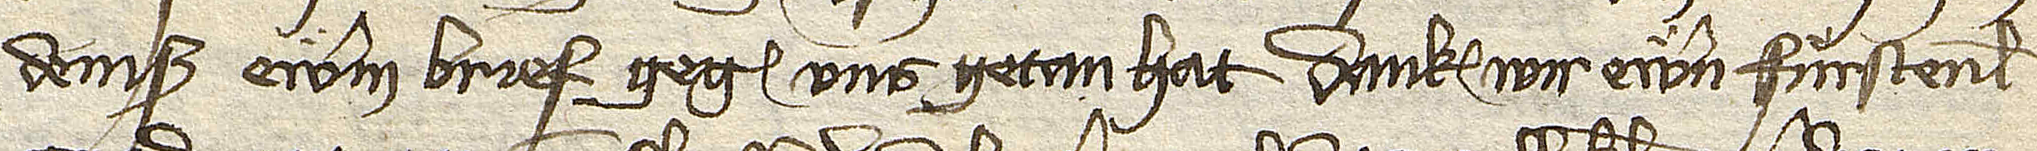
demſ* eẅ*m brief geg* vns getan hat Dank* wir eẅ*n fürſtenl*
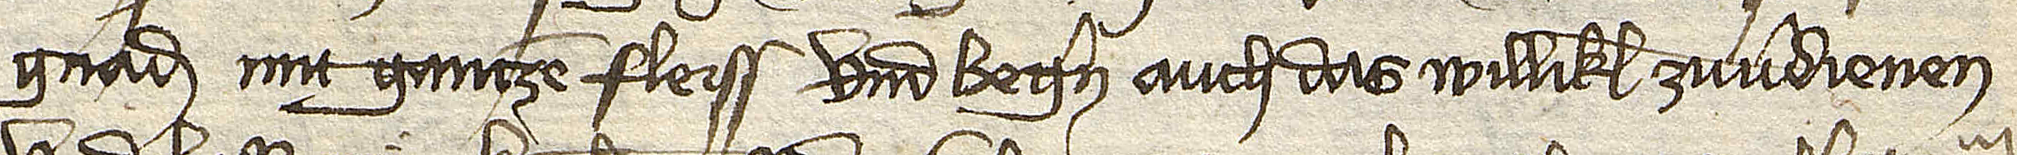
gnad* mit gancʒe* fleiſſ Vnd beg*n auch das willikl* ʒuu*dienen
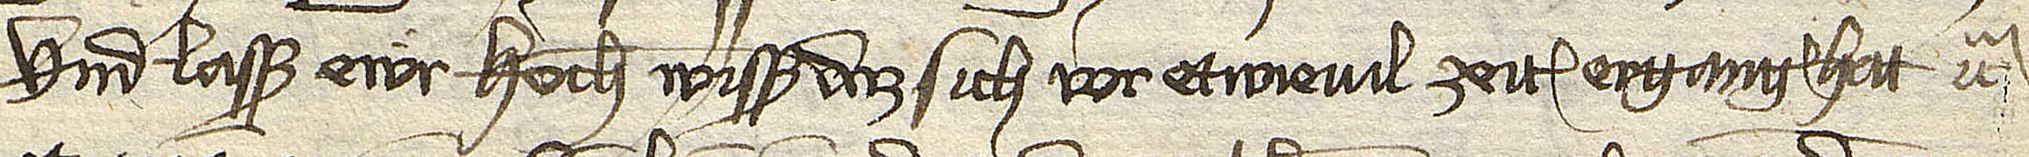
Vnd laſſ* eẅr Hoch* wiſſ* daʒ ſich vor etwieuil ʒeit* ergang* hat ec*
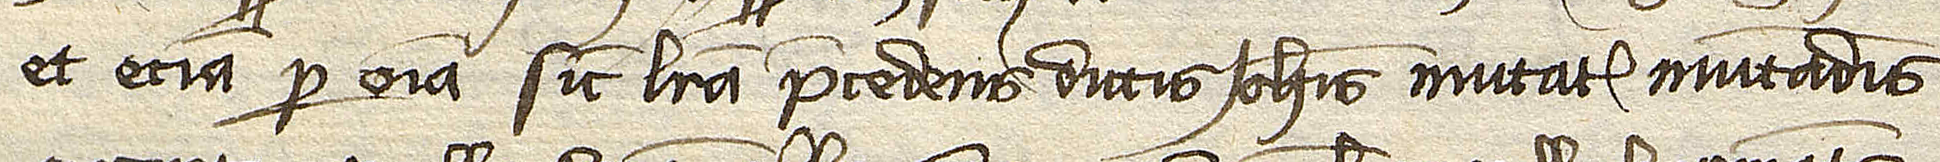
et ecia* p* oia* ſic*lra* p*cedens ducis Ioh*is mutat* muta*dis
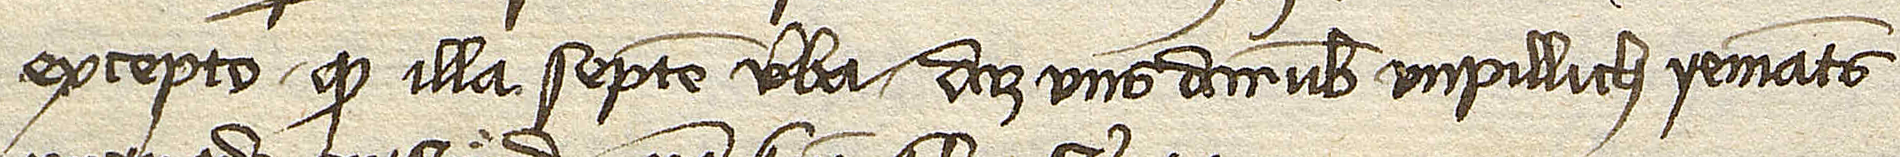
excepto / q* illa ſepte* v*ba / daʒ vns darub* vnpillich yema*ts
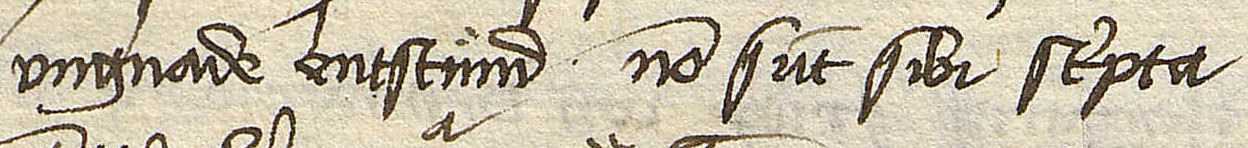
vngnade entſtünd . no* ſut* ſibi ſc*pta
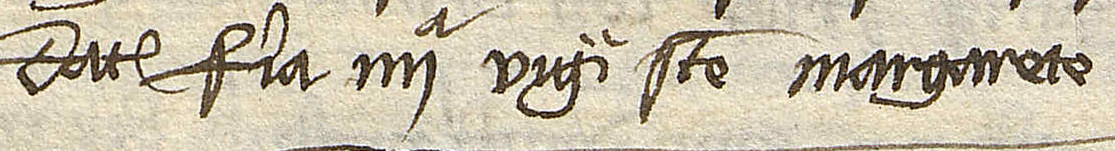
Dat* fi*a iiii* vigi* ſte* margarete
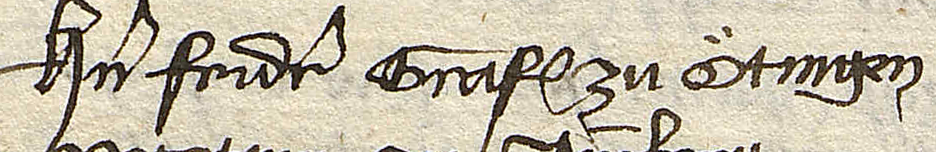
Hn* fridr* Graf* ʒu Ötingen
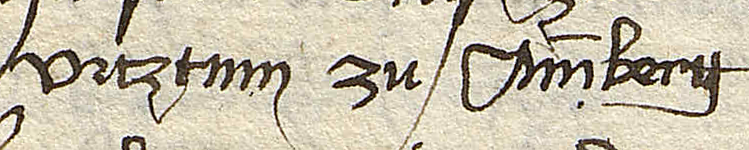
vicʒtum ʒu Am* berg
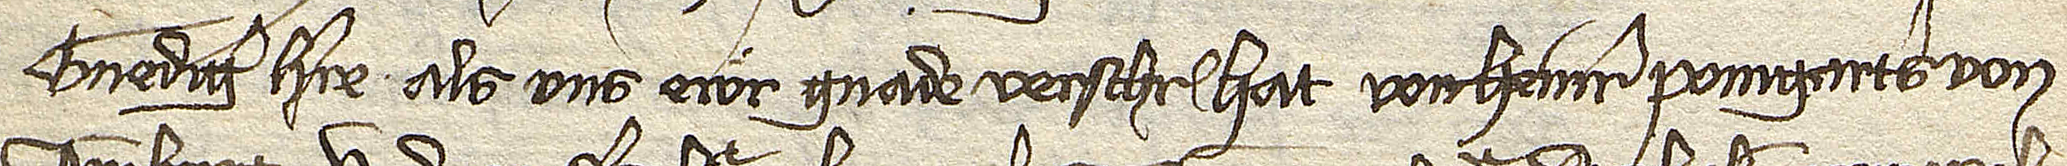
Gnedig* h*re . als vns eẅr gnade verſchr* hat von heinr* Pomgart*s von
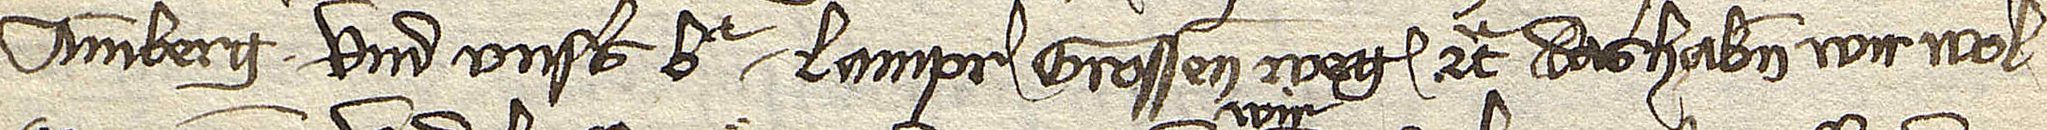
Am*berg . Vnd vnſ*s b* / Lampr* Groſſen weg* ec* / Das habn* wir wol
